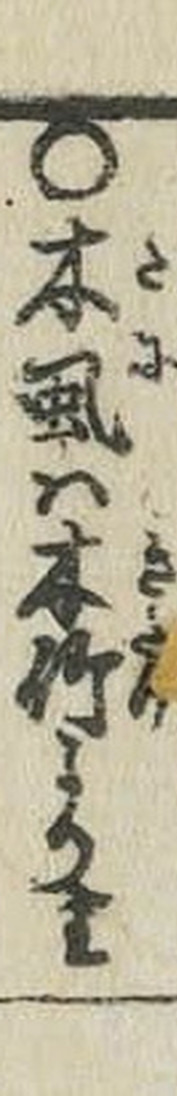○木虱は木竹より生
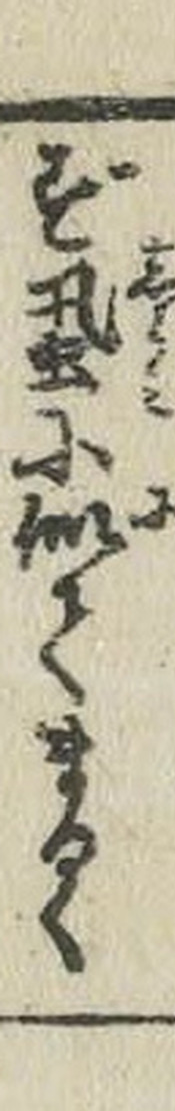ず蝨に似てまるく
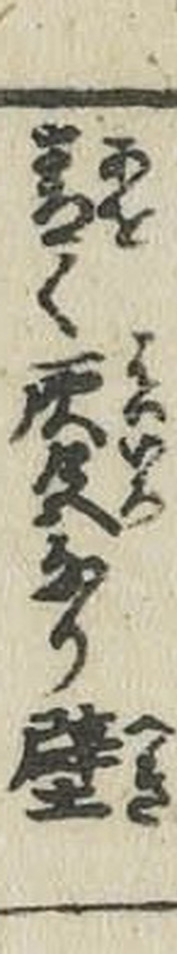青く灰色なり壁
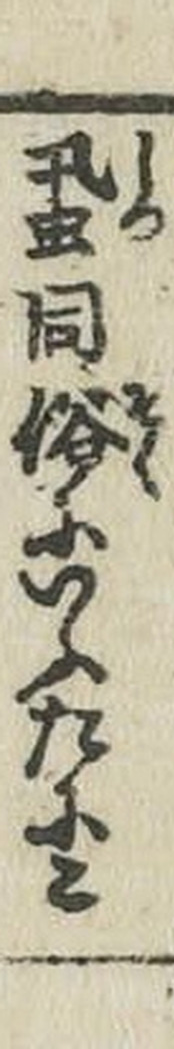蝨同俗にいふたにこ
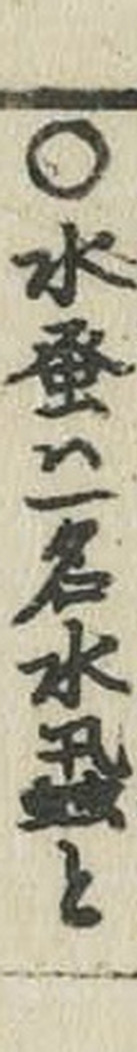○水𤼭は一名水蝨と
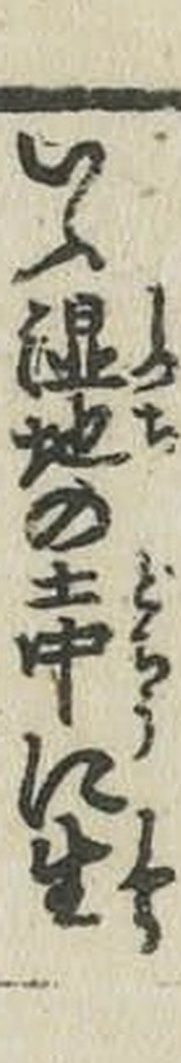いふ湿地の土中に生
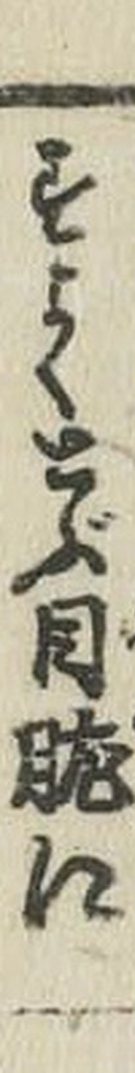すよくとぶ目肬に
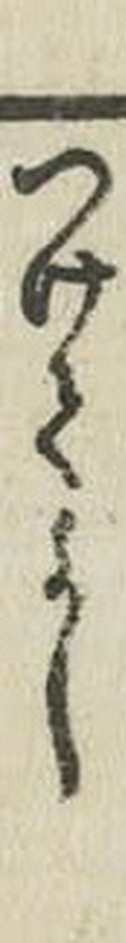つけてよし
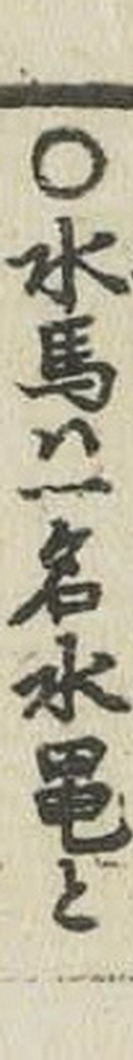○水馬は一名水黽と
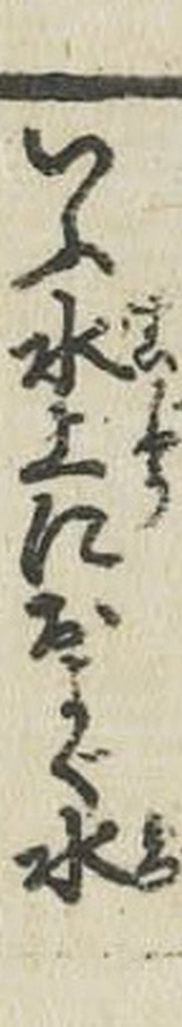いふ水上におよぐ水
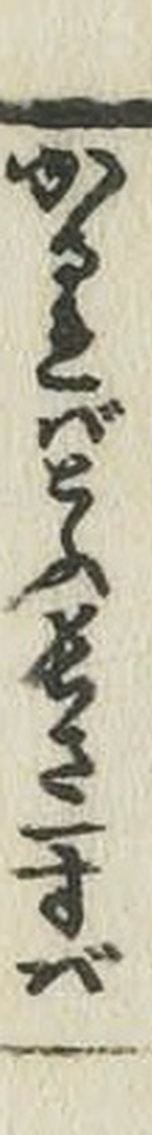かるればとふ長さ一寸ば
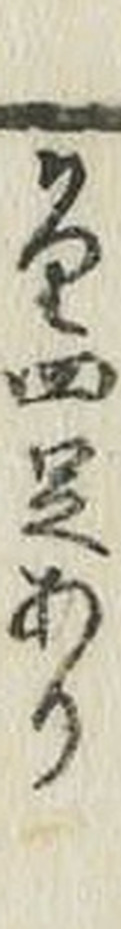かり四足あり
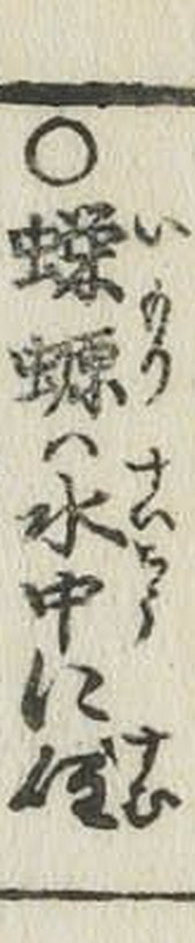○蠑螈は水中に住
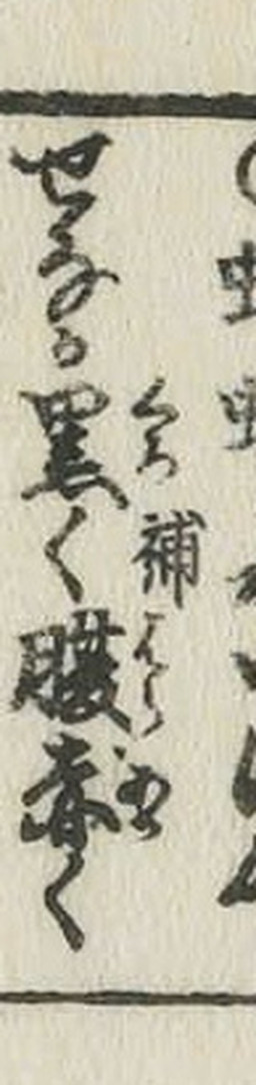せなか黒く腹赤く
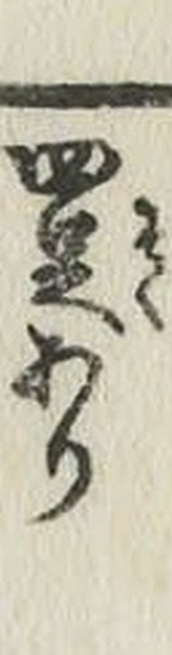四足あり
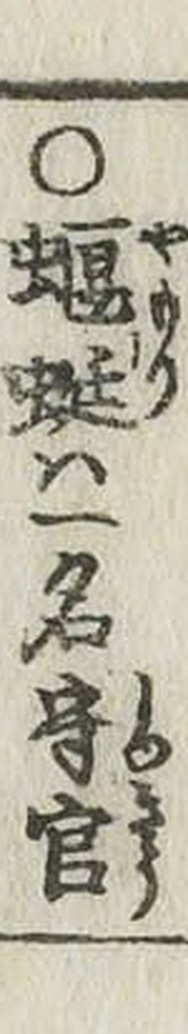○蝘蜓は一名守宮
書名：増補頭書訓蒙図彙大成 10巻 7:巻之14-16
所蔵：東京学芸大学教育コンテンツアーカイブ
